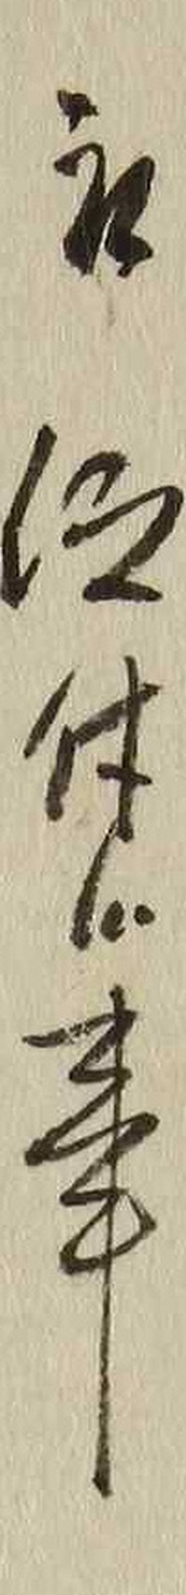被仰付候事
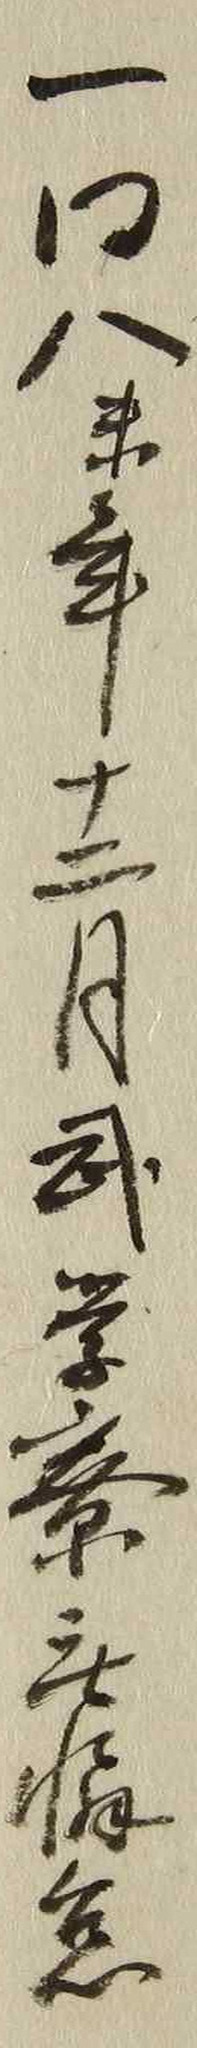一同八未年十二月武学寮無懈怠
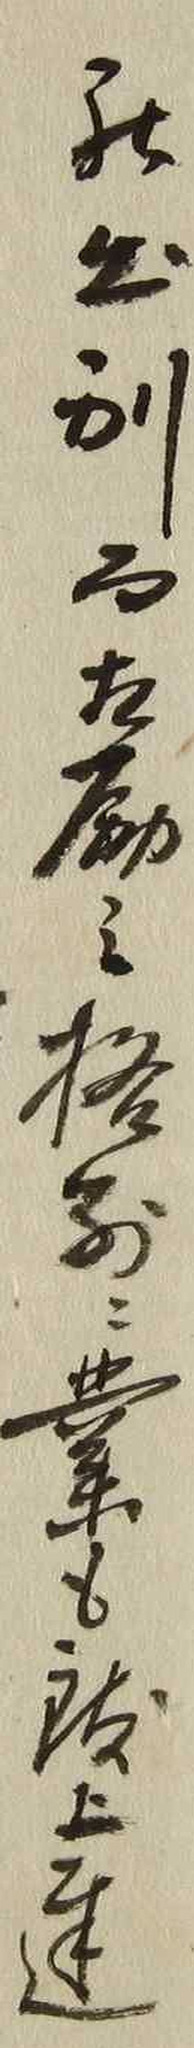罷出別而相励ミ格別ニ業も致上達
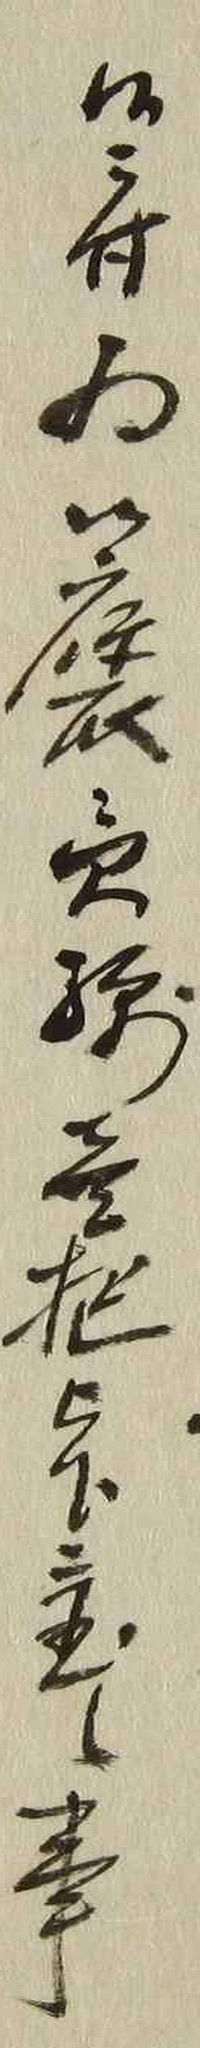候ニ付為御褒美綿壱把被下置候事
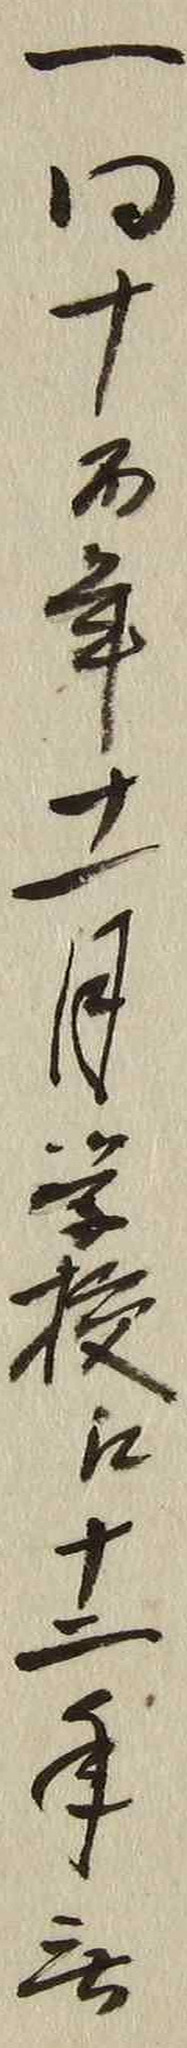一同十酉年十一月学校江十二年無
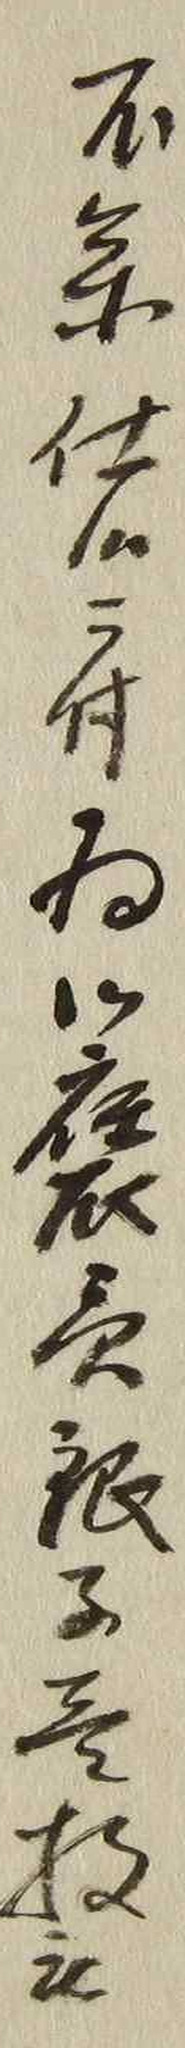不参仕候ニ付為御褒美銀子壱枚被
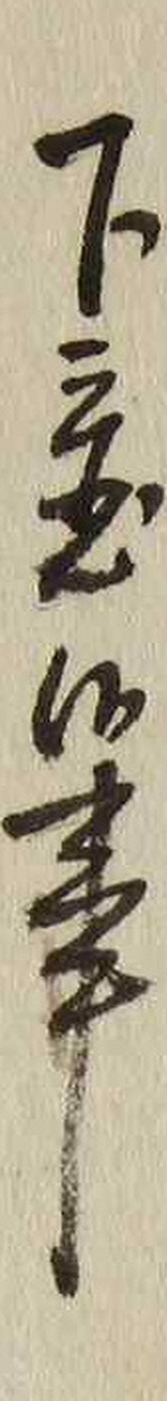下置候事
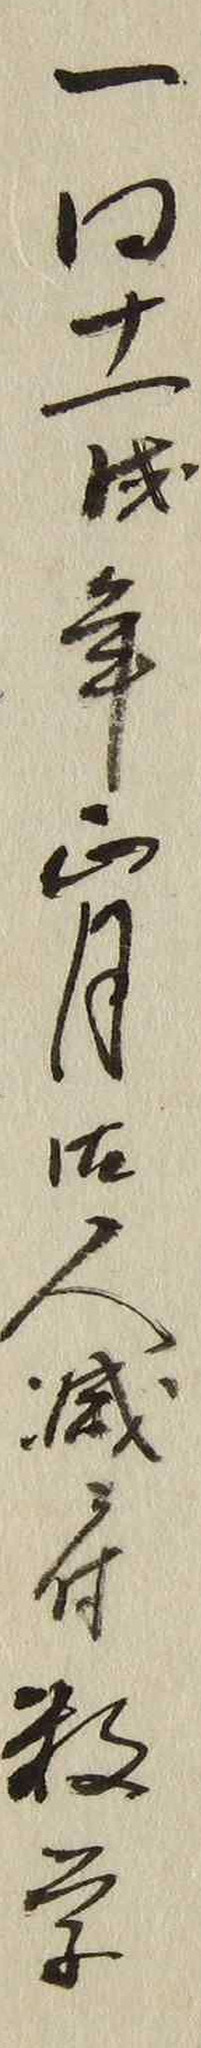一同十一戌年正月御人減ニ付数学
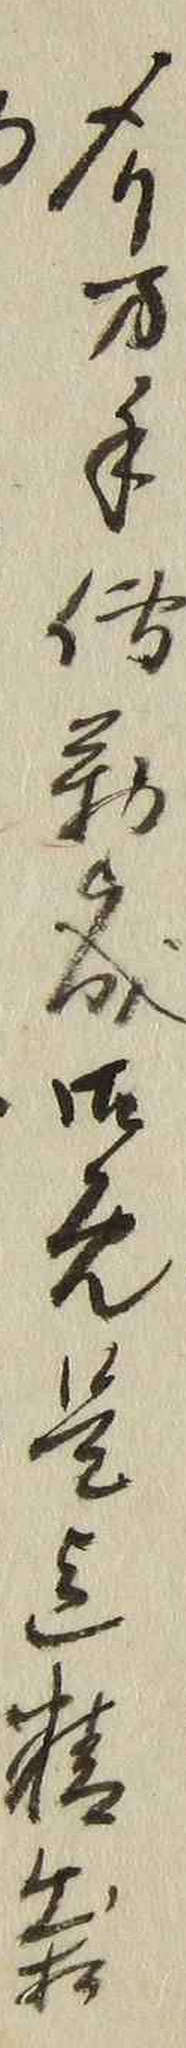〆り方手伝被成御免是迄精出相
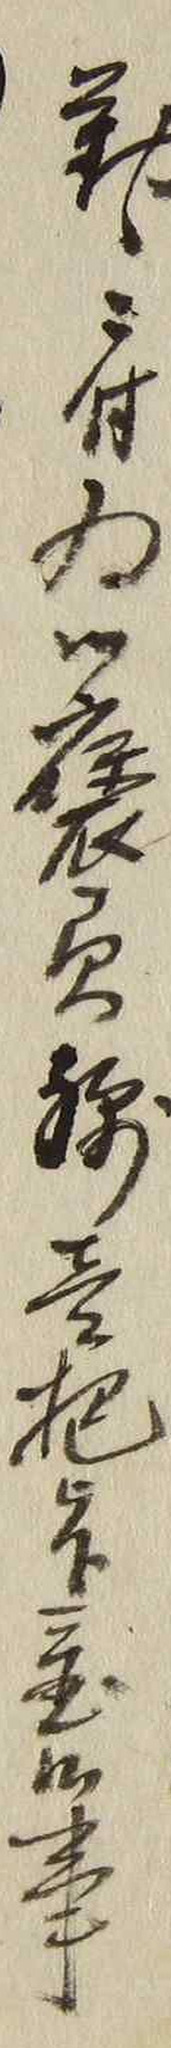勤候ニ付為御褒美綿壱把被下置候事
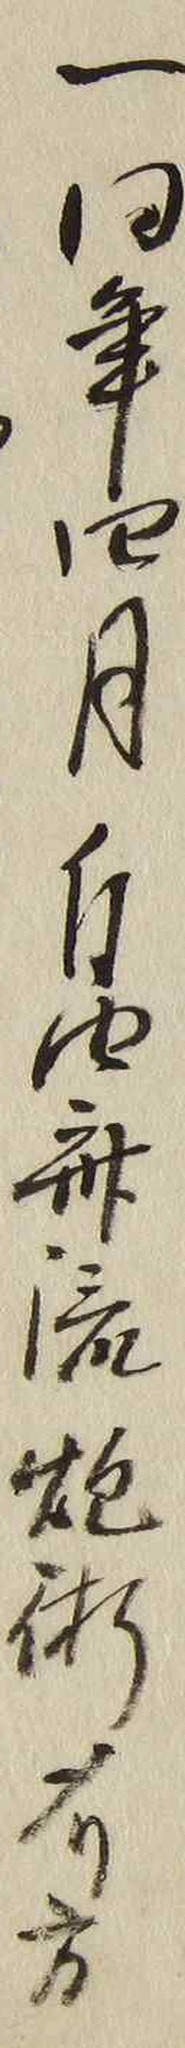一同年四月自由斎流炮術〆り方
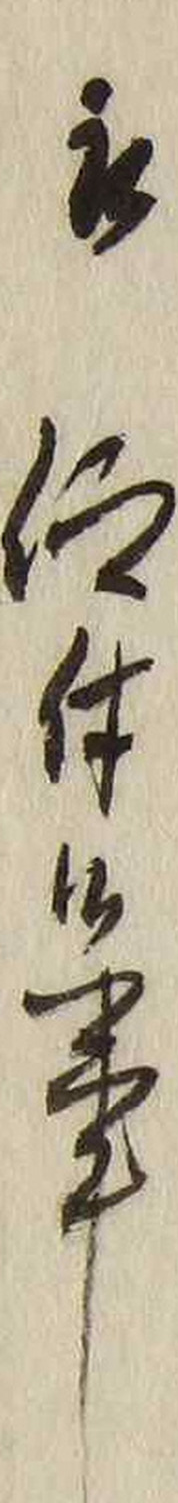被仰付候事

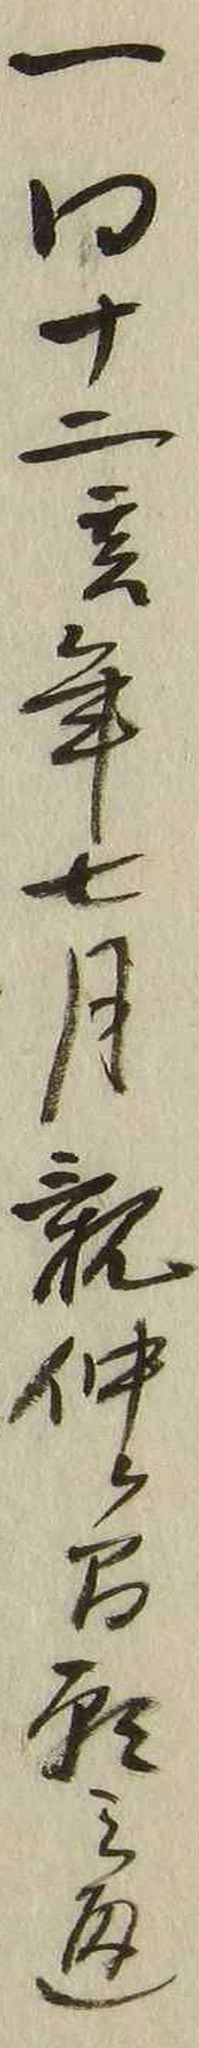一同十二亥年七月親仲ケ間願之通
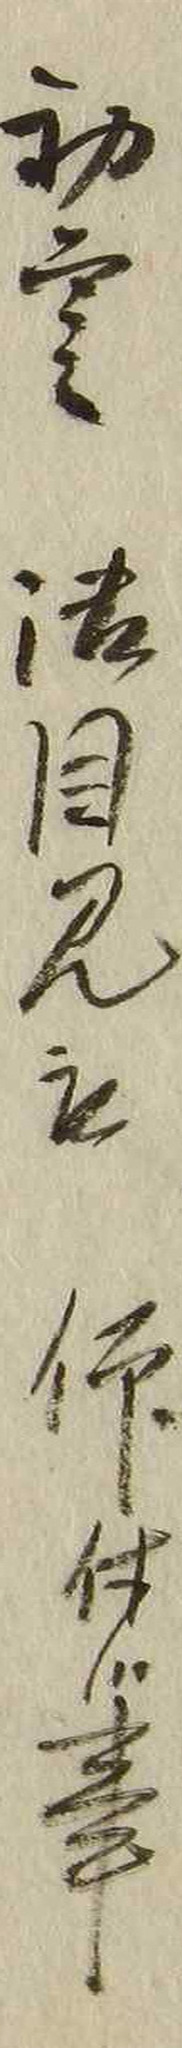初而之御目見被仰付候事
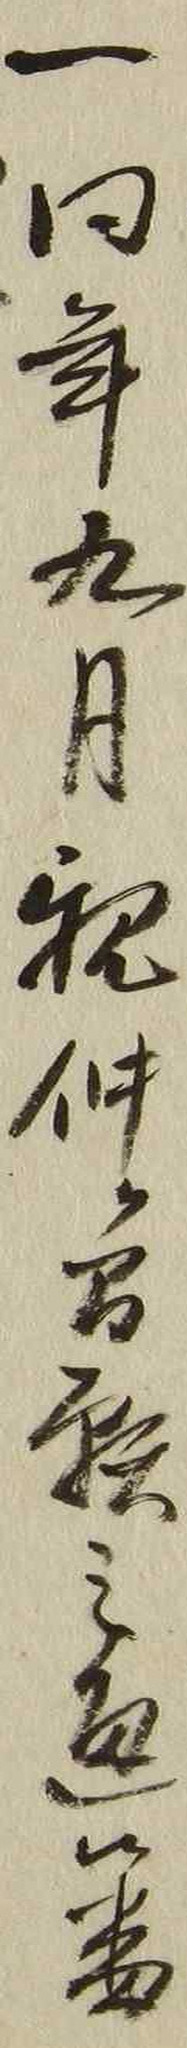一同年九月親仲ケ間願之通御番
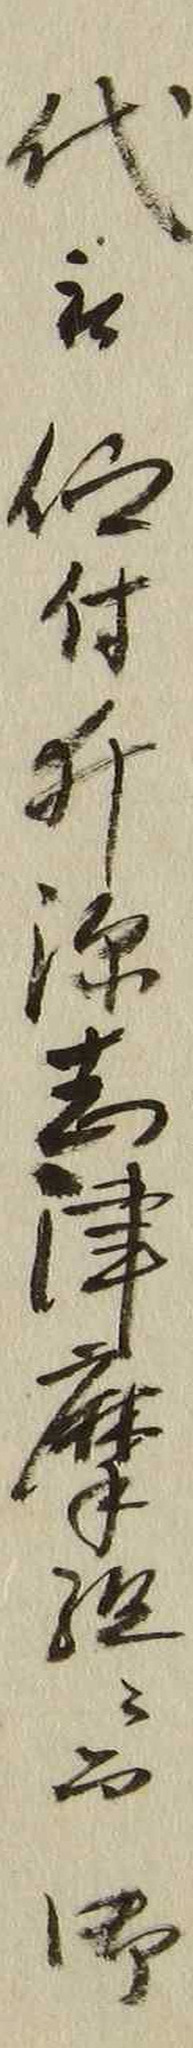代被仰付井深志津摩組ニ而御
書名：諸士系譜　巻之359　す之部9
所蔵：会津若松市立会津図書館
